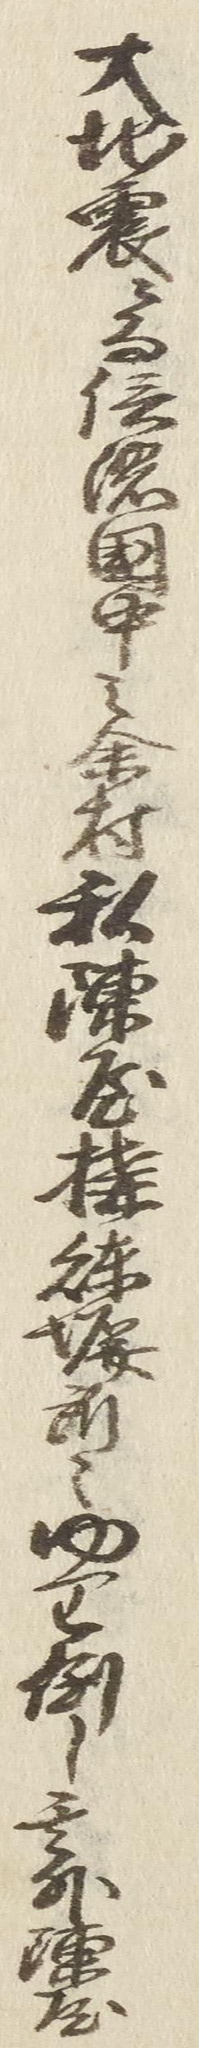大地震二而信州中之余村私陣屋構練塀所々ゆり倒し其外陣屋
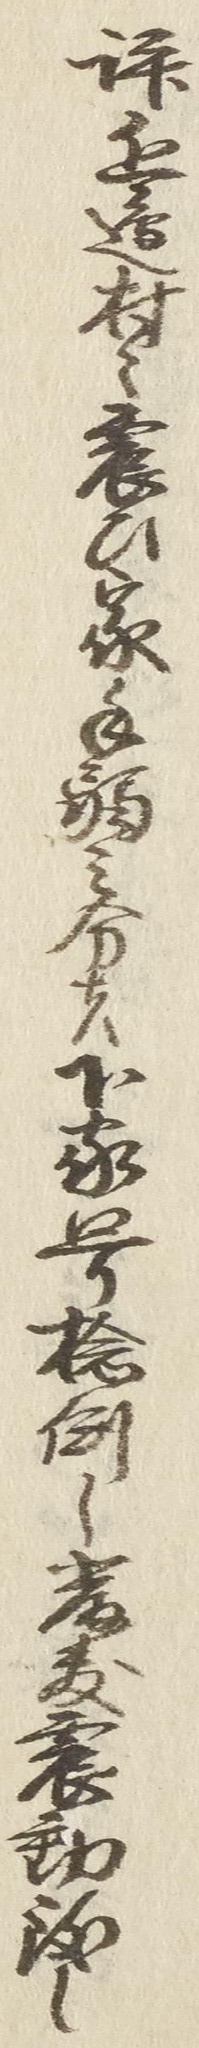先許近辺村々震ひ家手弱之分は下家廻り捻倒し厳敷震動致し
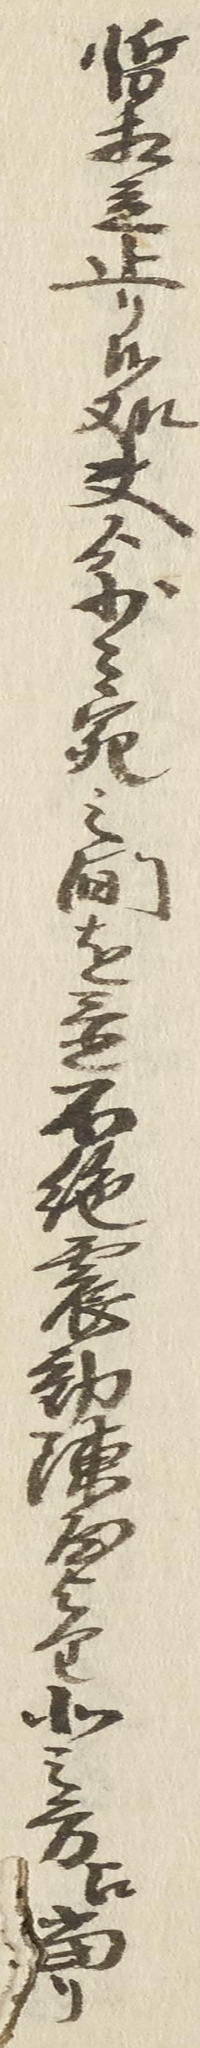暫相立止り候処夫ゟ少々宛之間を置不絶震動陣屋より北之方江当り
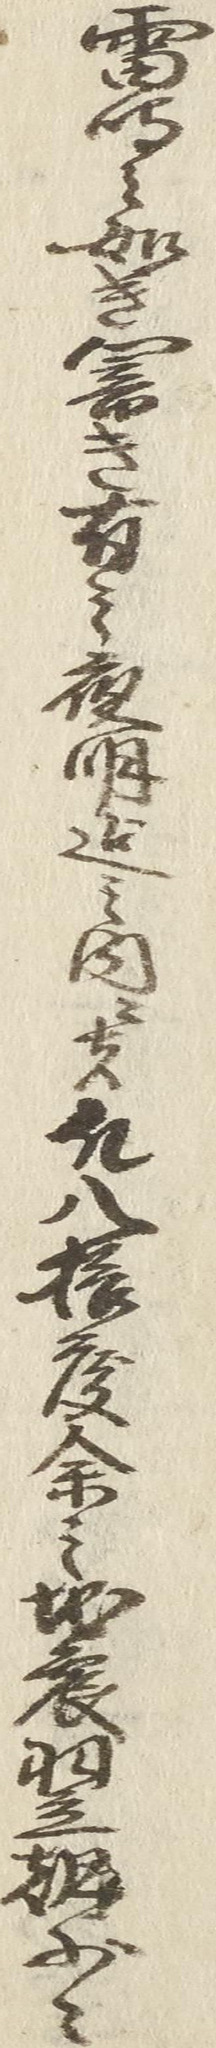雷鳴之如き響き有之夜明迄之内二は凡八十度余之地震翌朝少々
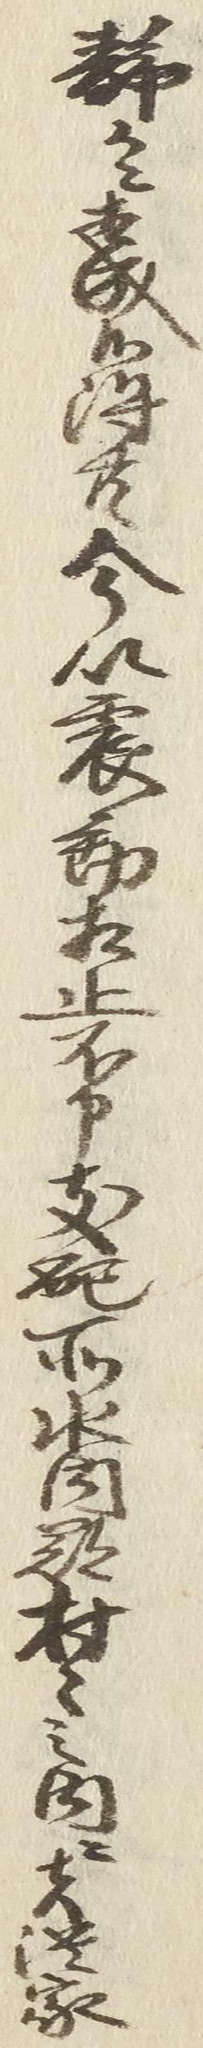静かに相成候得共今以震動相止不申支配所水内拾村々之内二は潰家
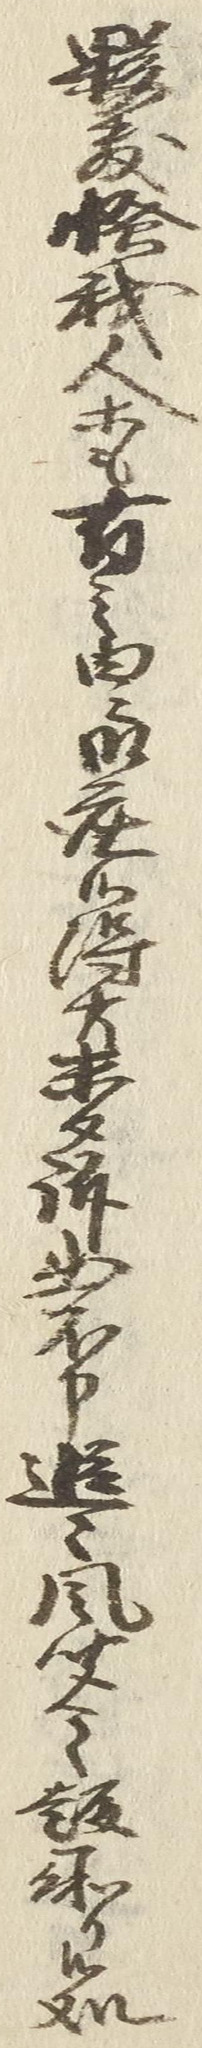厳敷怪我人等も有之由二御座候得共未タ訴出不申追々風聞之趣承候処
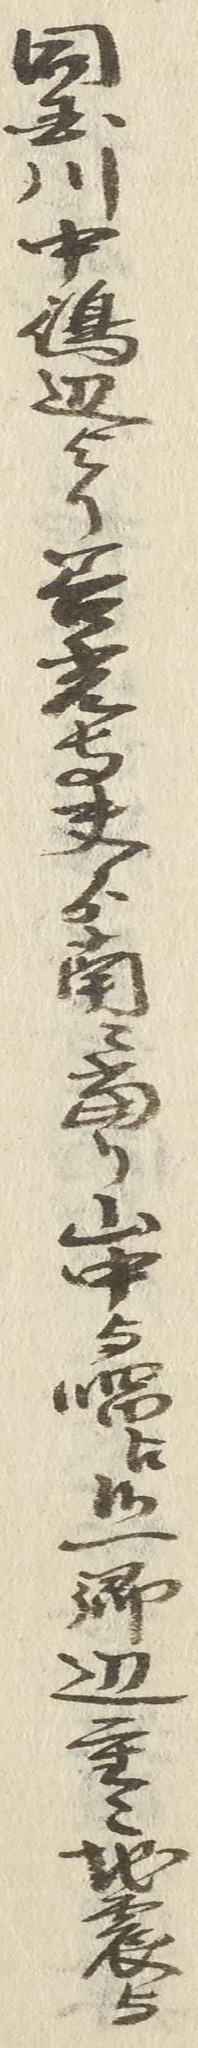同国川中嶋辺より善光寺夫ゟ南二当り山中と唱江候一郷辺重々地震
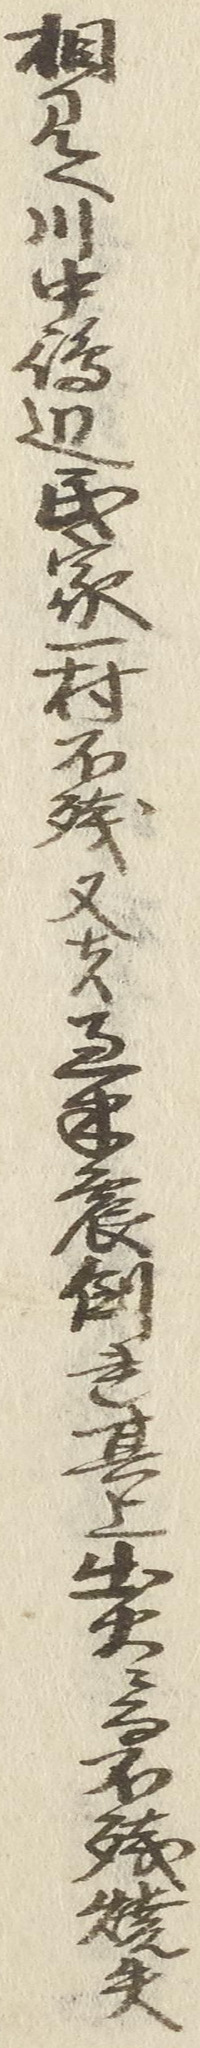相見へ川中嶋辺民家一村不残又は過半震倒其上出火二而不残焼失
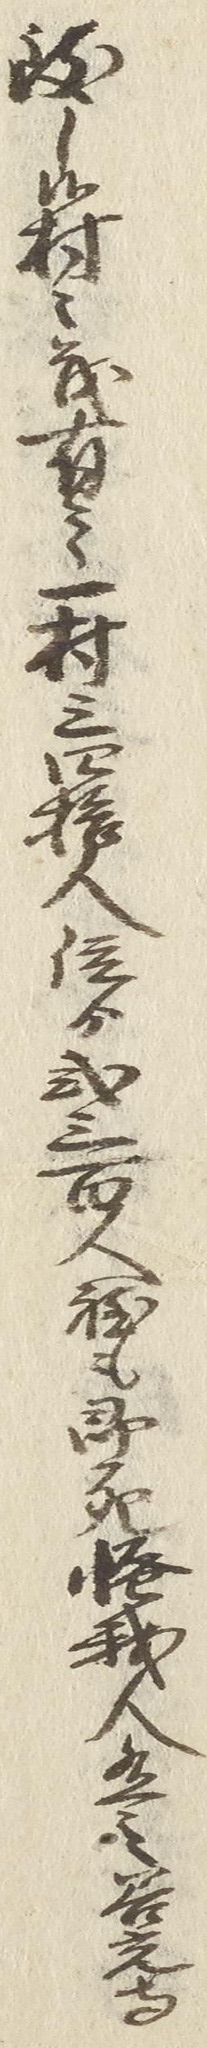致し候村々も有之一村三四拾人位ゟ弐三百人程も即死怪我人有之善光寺
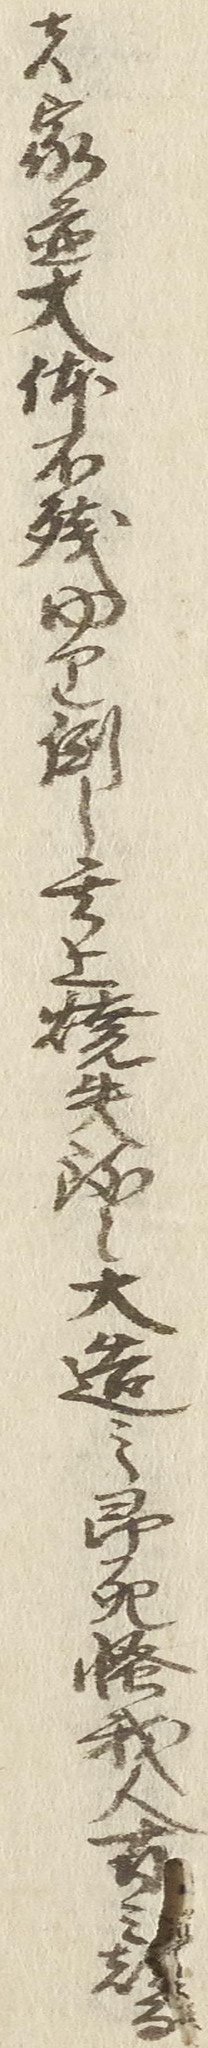は家並大体不残ゆり倒し其上焼失致し大造之即死怪我人有之都而
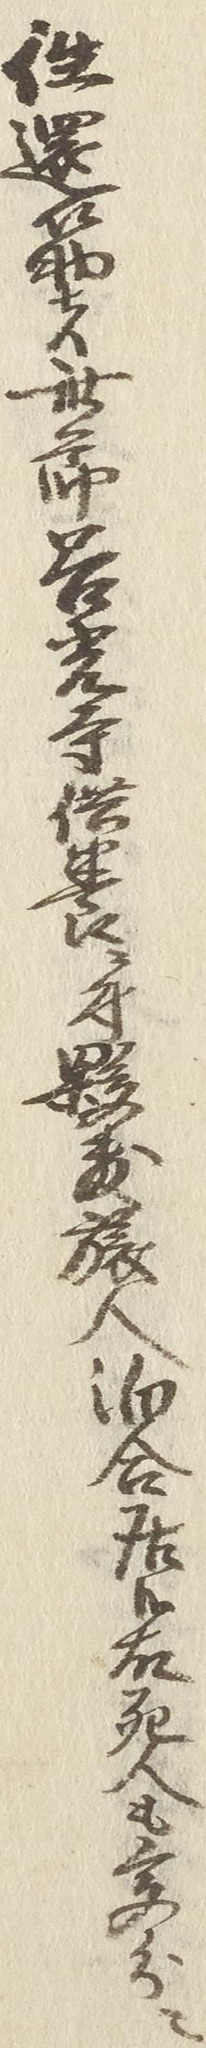往還筋は此節善光寺供養ニ付夥敷旅人泊合居候故死人も多分二
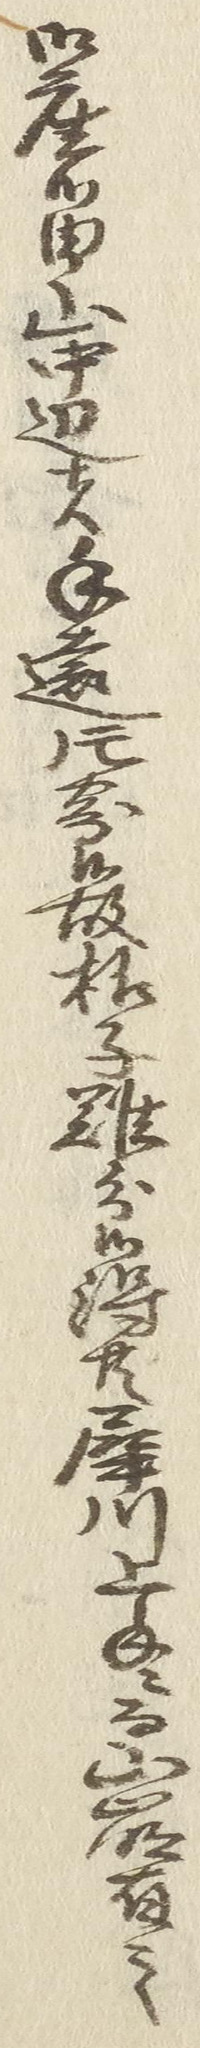御座候由山中辺は手遠片寄候故様子難分候得共犀川上手二而山崩有之
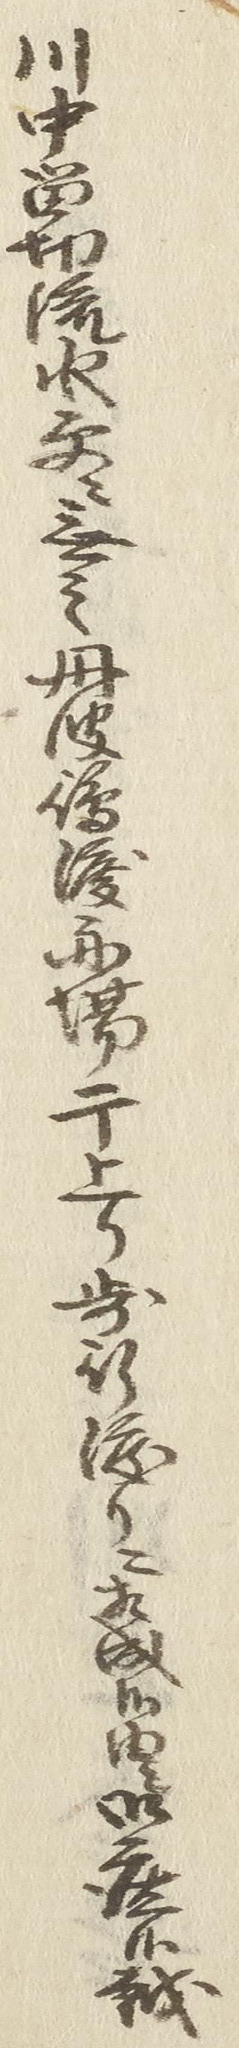川中留切流水更二無之丹波嶋渡舟場干上り歩行渡り二相成候由二御座候越
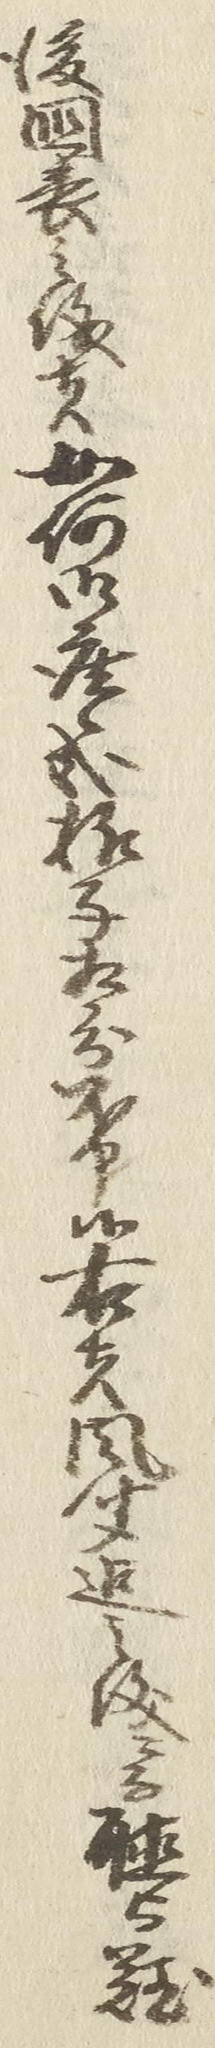後国表之儀は如何御座候哉様子相分不申候右は風聞迄之儀二而聢と難
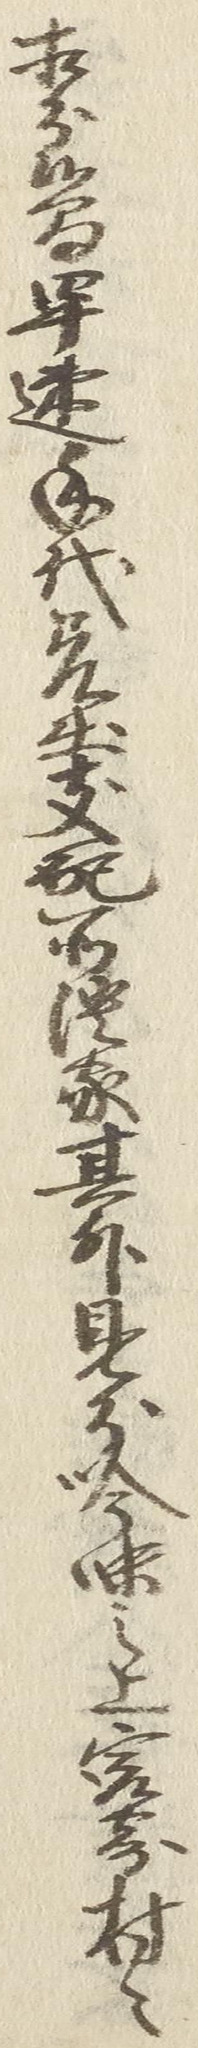相分候間早速手代差出支配所潰家其外見分吟味之上外最寄村々
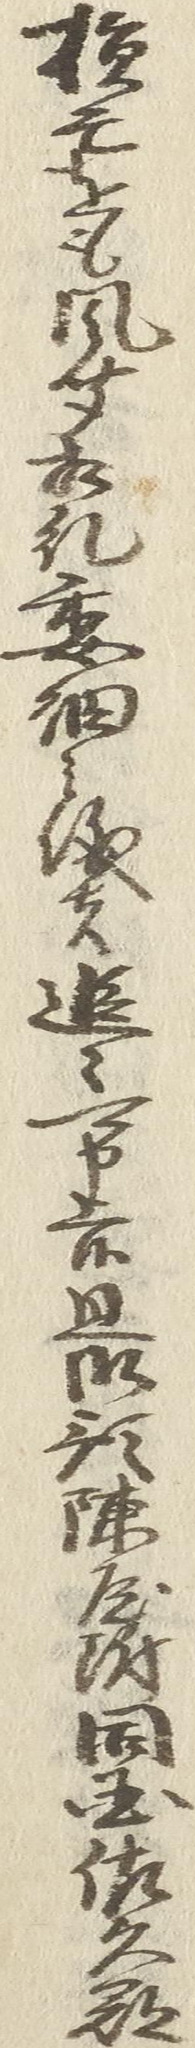損亡をも風聞相糺し委細之儀は追而々可申上候且御預陣屋附同国佐久郡
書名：従往古地震御届書記誌之一
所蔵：東京大学地震研究所図書室 Earthquake Research Institute Library, The University of Tokyo, JAPAN
